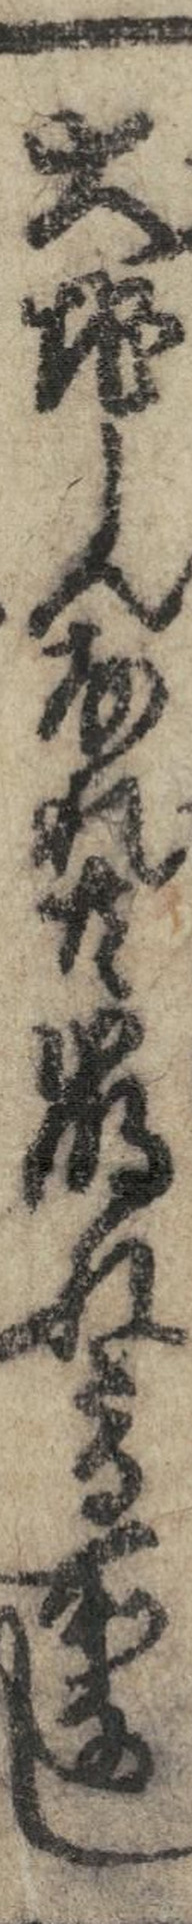大地しんなれ共崩れたる所なし
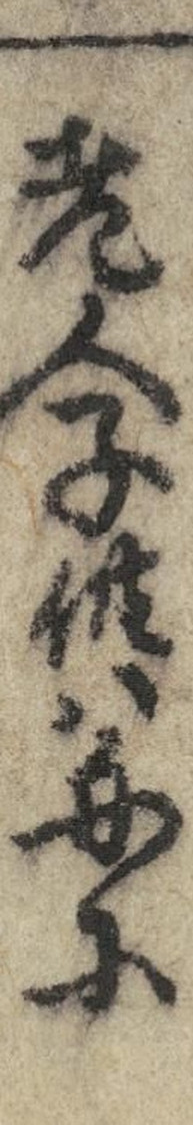老人子供は舟に
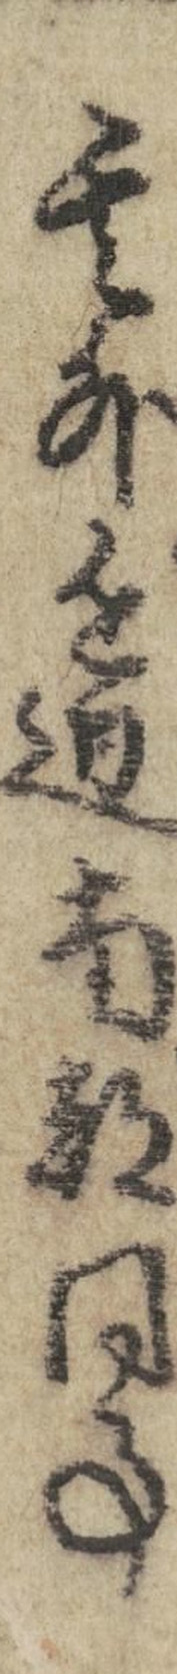其外近辺南都同事
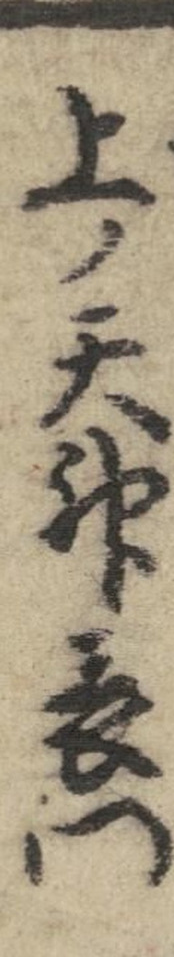上ノ天神長門
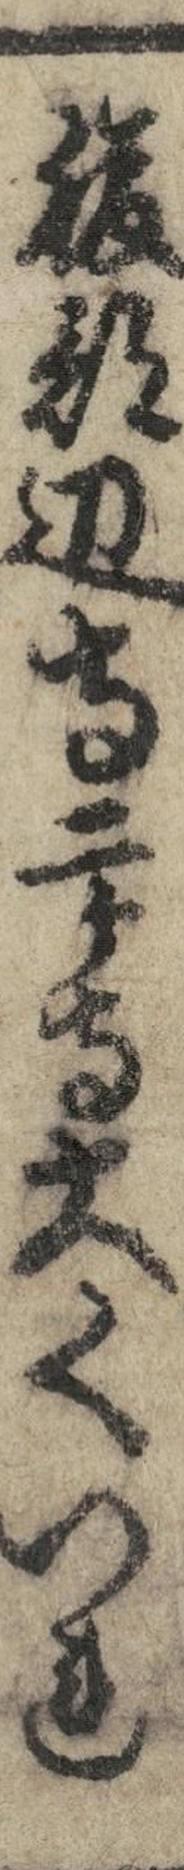服部辺寺ニケ寺大くつれ
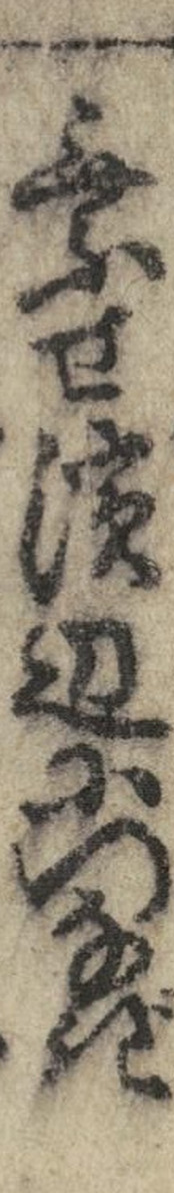乗せ浜辺につなぎ
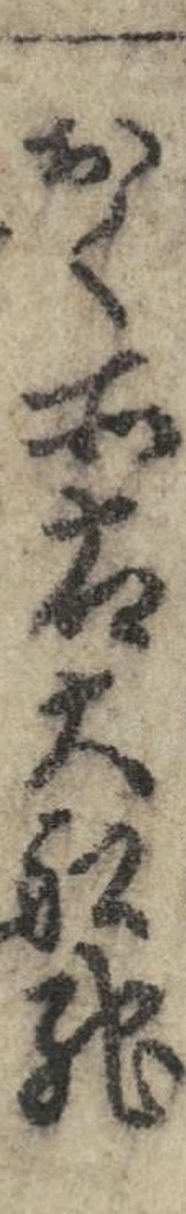おく所右大船馳
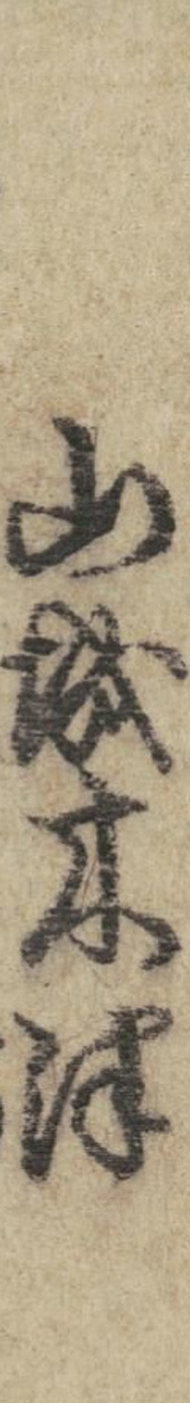山城木津
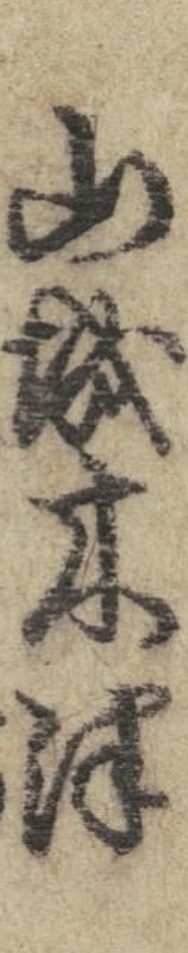山城木津
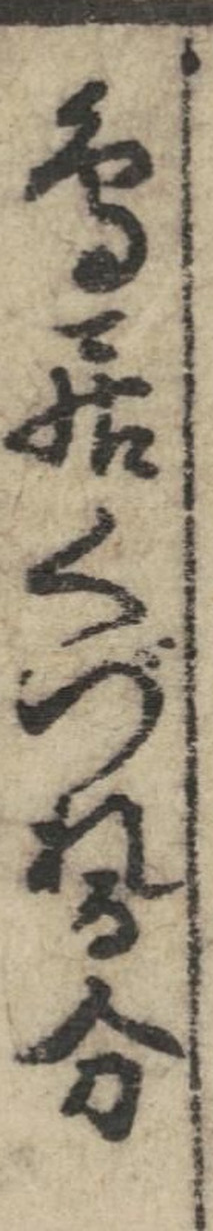鳥居くづれる分
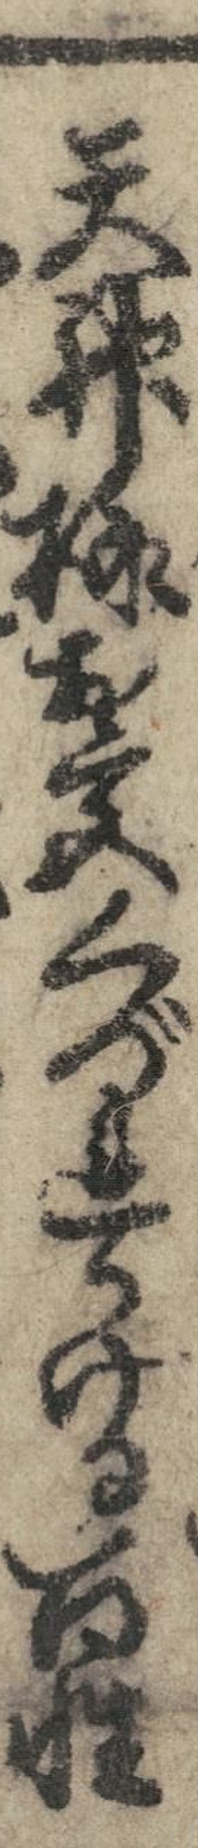天神様お宮くづれかける百性
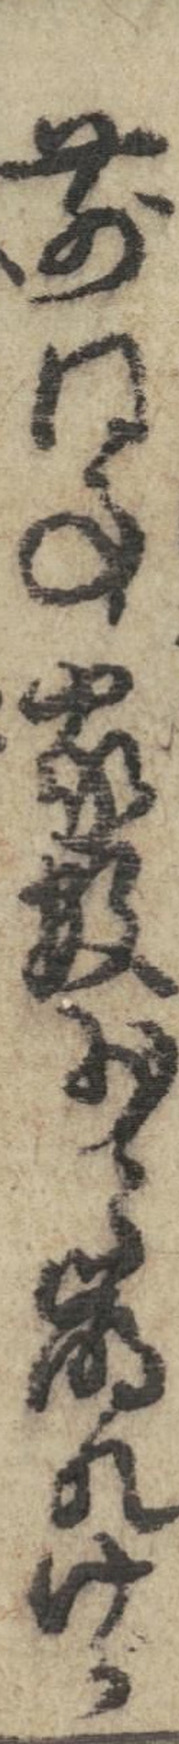前同事家数少〻崩れけか
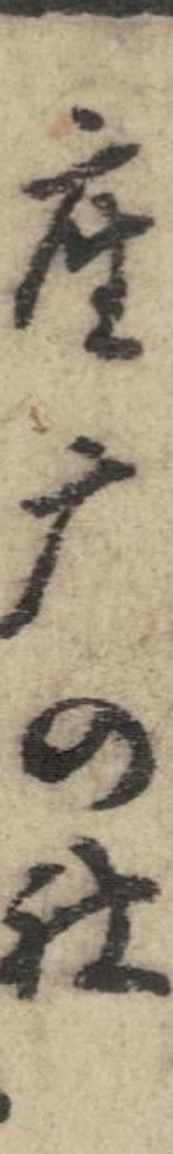座摩の社
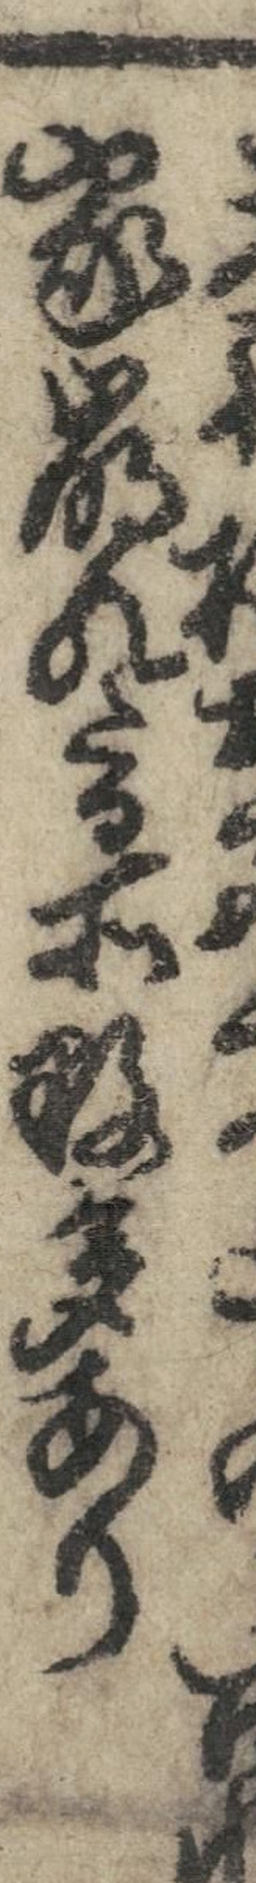家崩れたる所数多あり
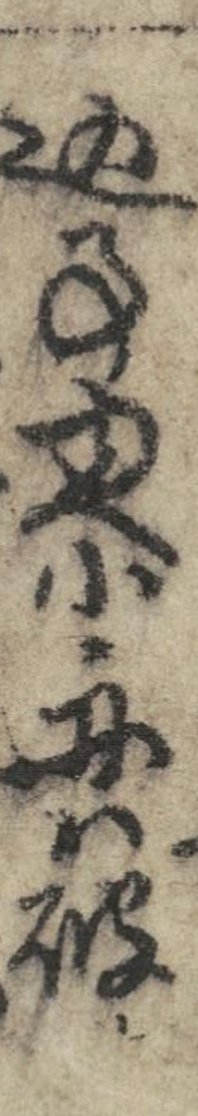込事ゆへ小舟は破レ
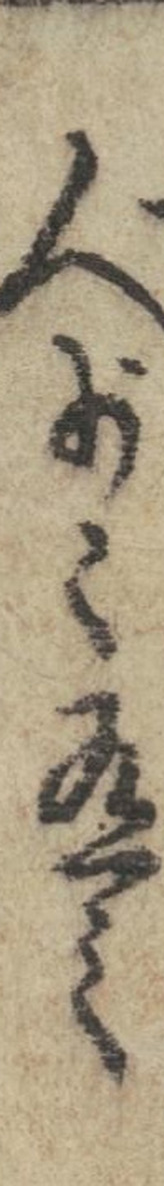人少〻有之
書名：諸国大阪太地震大つなミ末代噺
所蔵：東京大学地震研究所図書室 Earthquake Research Institute Library, The University of Tokyo, JAPAN
